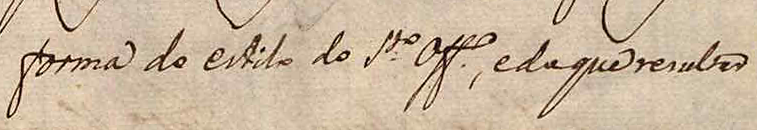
forma do estilo do S.to Off.o, e do que resultar
